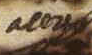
aceito
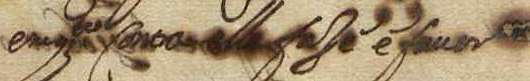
em qto Contra elle fazē ē fauor
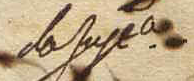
da Just.a.
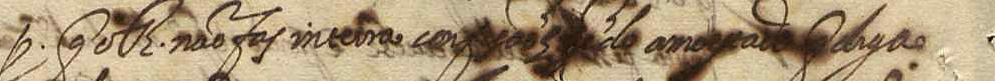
Ꝓ q̄ o R. naõ faz inteira confisaõ E sendo amoestado q̄ diga
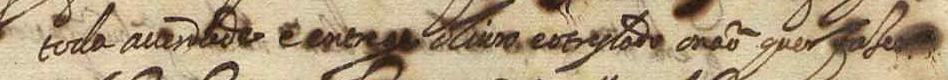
toda a uerdade e entrege o liuro e o treslado o naõ quer fazer
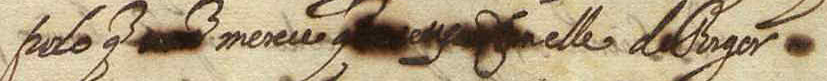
pelo q̄ naõ merece q̄ se use Com elle de Rigor
